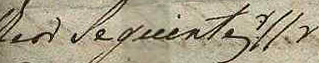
heor Seguinte r//r
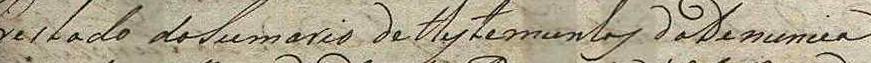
reslado do Sumario de thestemunhos da Denuncia
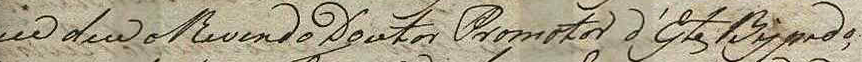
ue deu o Reverendo Doutor Promotor d'Este Bispado,
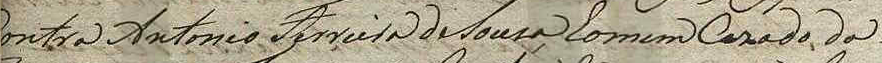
ontra Antonio Ferreira de Souza, homem Cazado, da
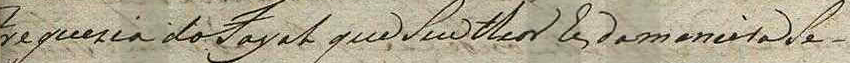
reguezia do Fayal que Seu theor he da maneira Se
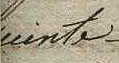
uinte
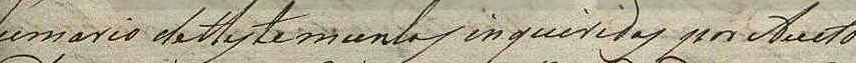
Sumario de thestemunhas inquiridas por Aucto
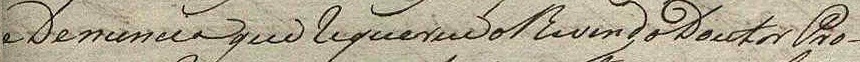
e Denuncia que Requereu o Revendo Doutor Pro
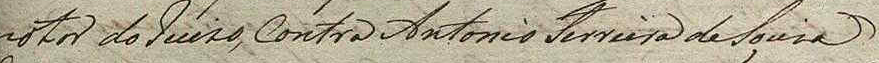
otor do Iuizo, Contra Antonio Ferreira de Souza
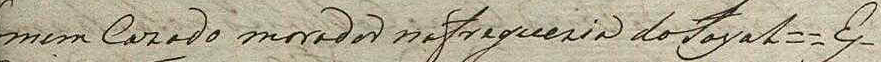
mem Cazado morador na freguezia do Fayal = = Es
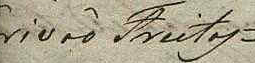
rivaõ Freitas=
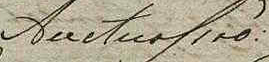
Auctuassaõ:
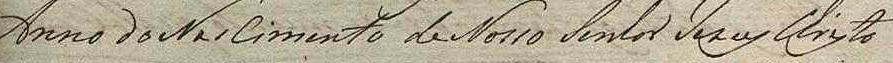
Anno do NasCimento de Nosso Senhor Iezus Christo
